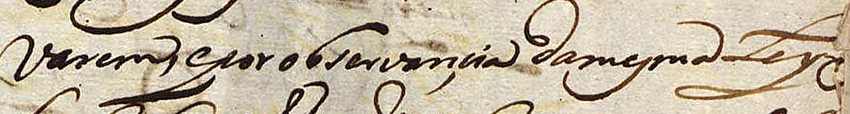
varem, e por observancia da mesma Ley
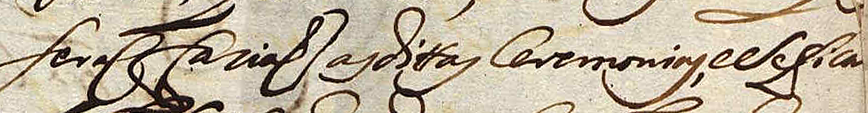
seraõ faziaõ as dittas Ceremonias, e se fica
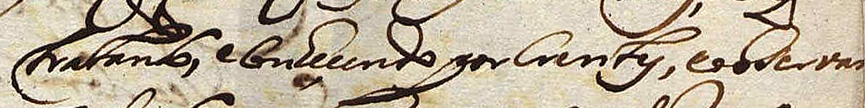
tratando, e conhecendo por Crentes, e observan
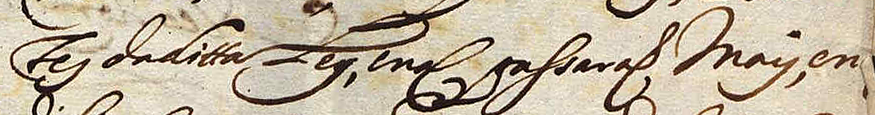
tes da ditta Ley, e naõ passaraõ mais, en
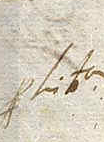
ꝑhib̄a.
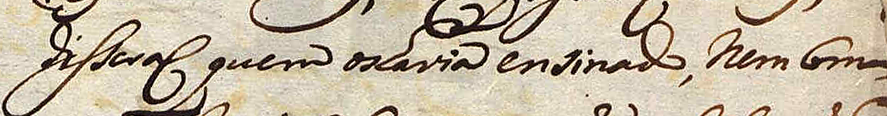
disseraõ quem os havia ensinado, nem Com
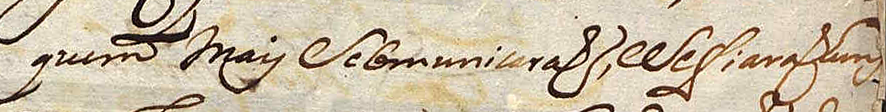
quem mais Se comunicaraõ, e Se fiaraõ hun
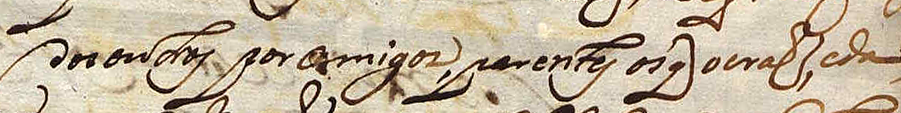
dos outros por amigoz, parentes os q̄ o eraõ, e da
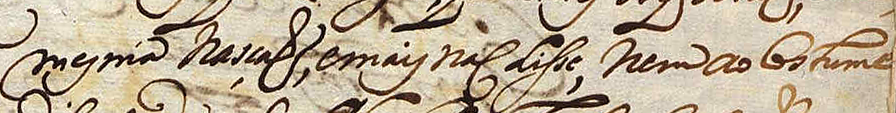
mesma nasçaõ, e mais naõ disse, nem ao Costume
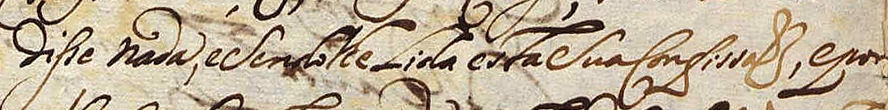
disse nada, e Sendolhe Lida esta Sua Confissaõ, e por
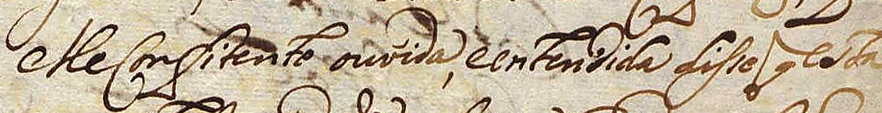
elle Confitente ouvida, e entendida disse q̄ esta
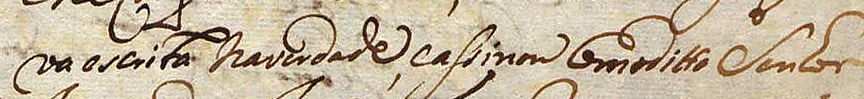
va escrita na verdade, e assinou Com o ditto Senhor
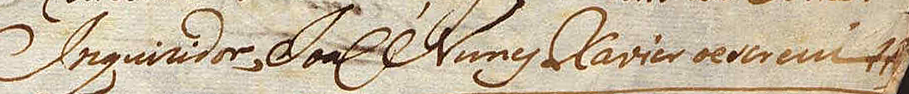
Jnquizidor, Ioaõ Nunes Xavier o escreui
